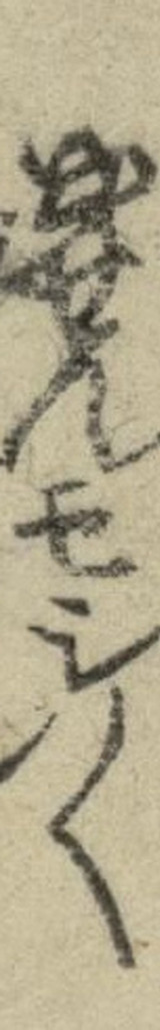やせんモシ〳〵
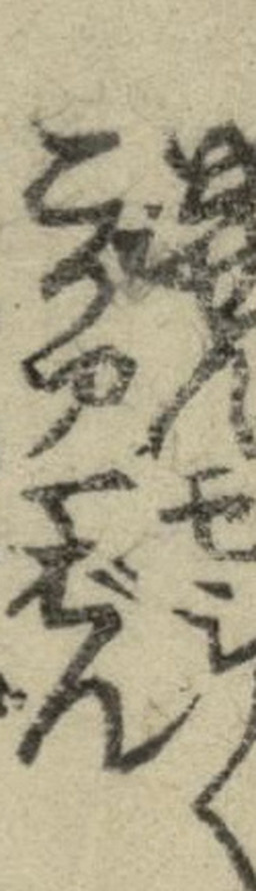こりア一ばん
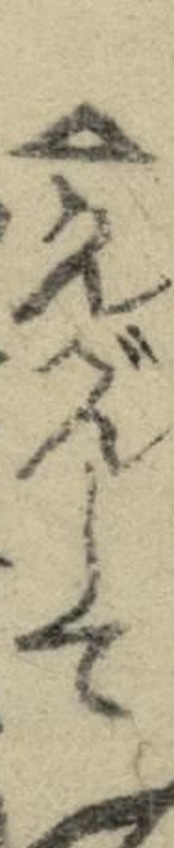△かんべんして
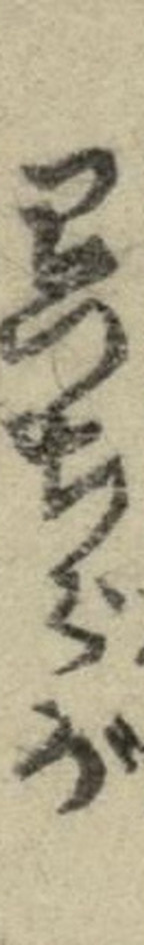わつちらが
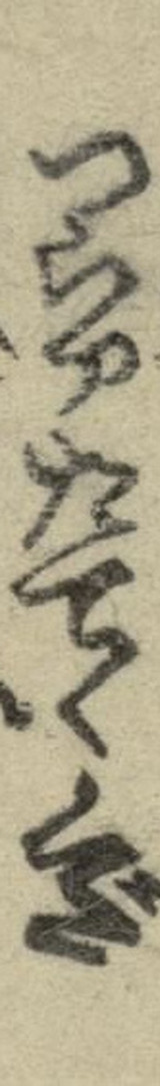つらアたてゝくだ
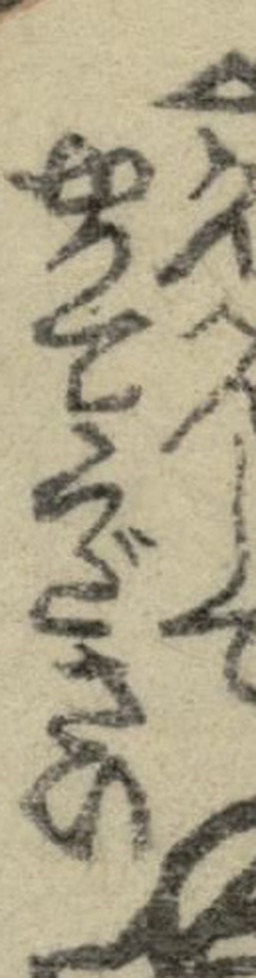やつてください
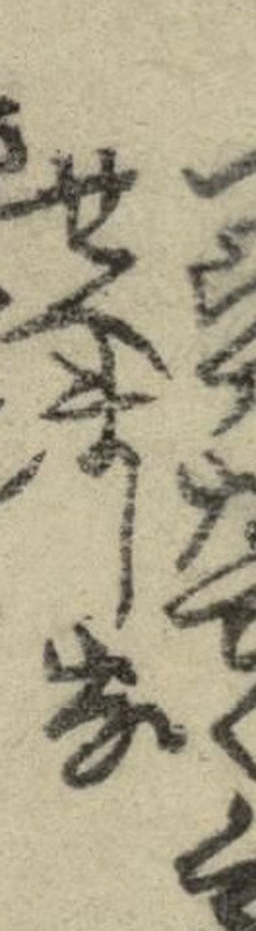せへましな
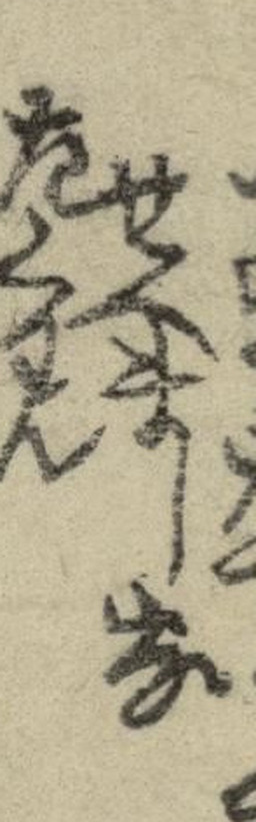左くわん
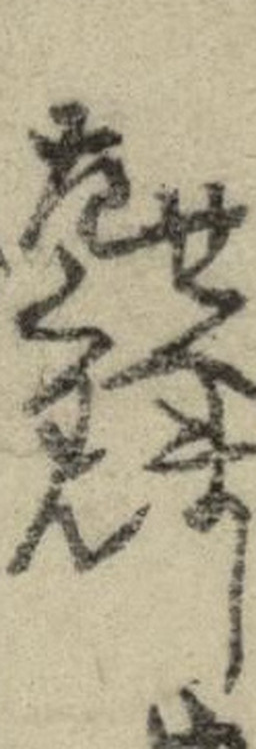左くわん
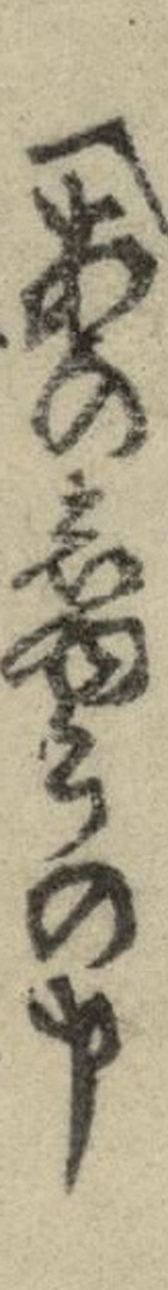〽おのしやらの申
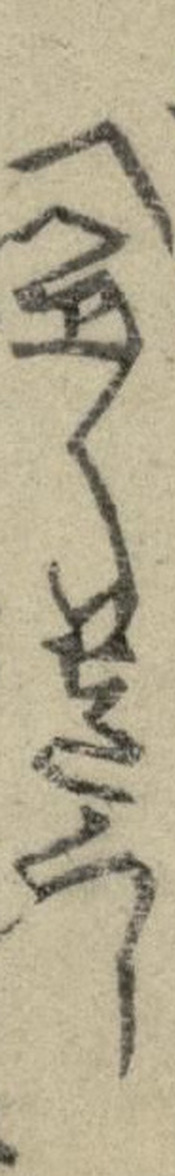〽ヘエ〳〵わたくし
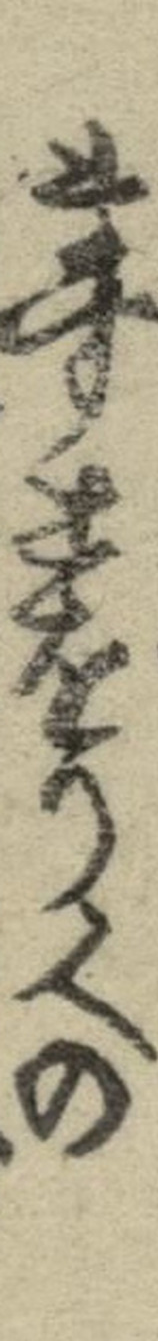ますとをり人の
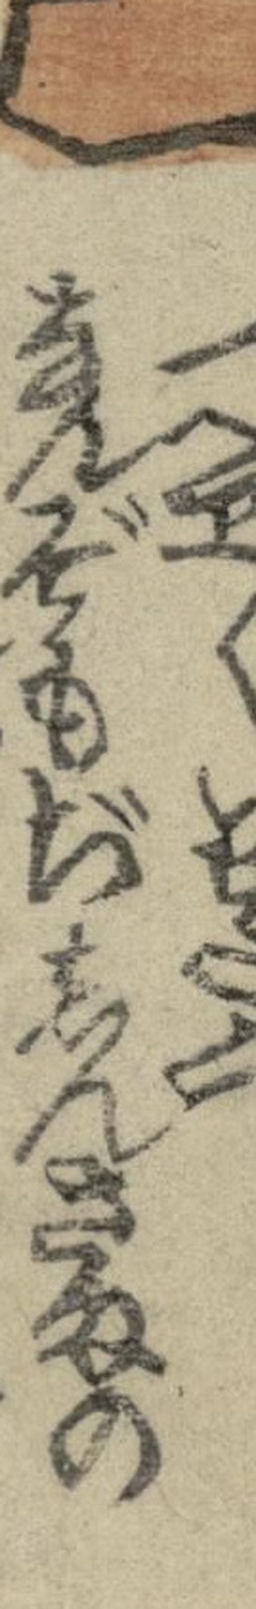なんぞもぢしんさまの
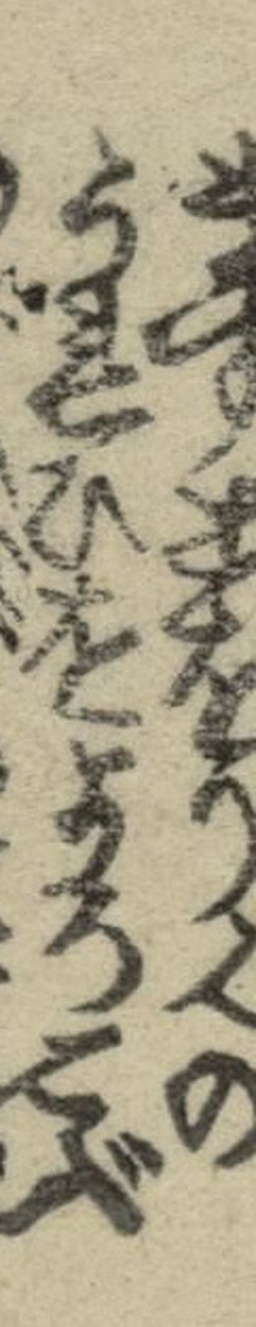うれひをよろこぶ
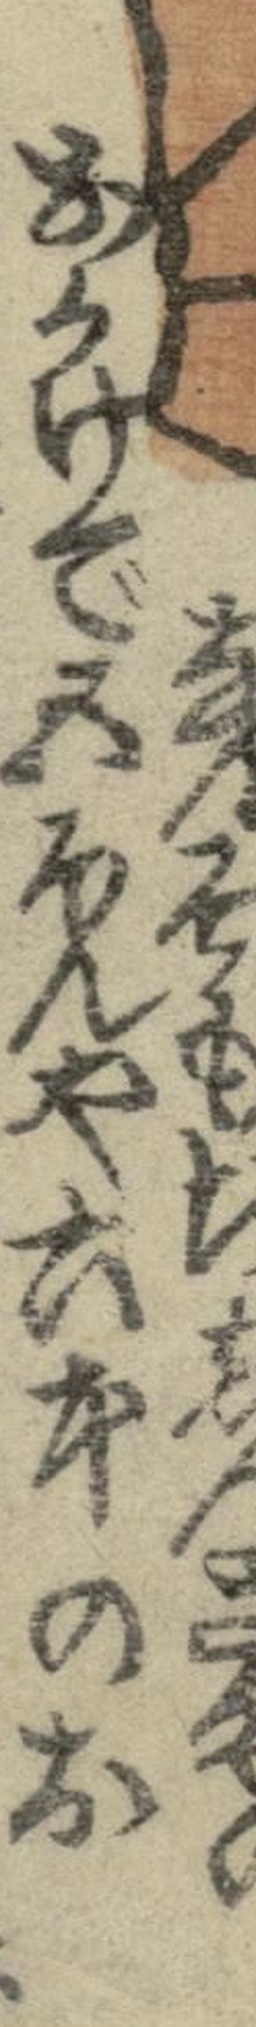おかけで五ほんや六本のお
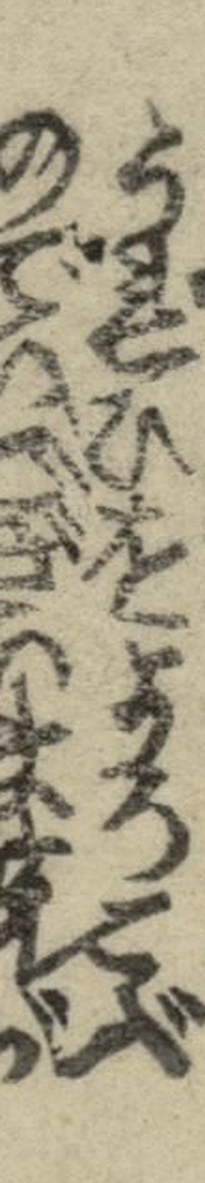のではございませんが
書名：生捕ました三度の大地震
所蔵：東京大学地震研究所図書室 Earthquake Research Institute Library, The University of Tokyo, JAPAN
